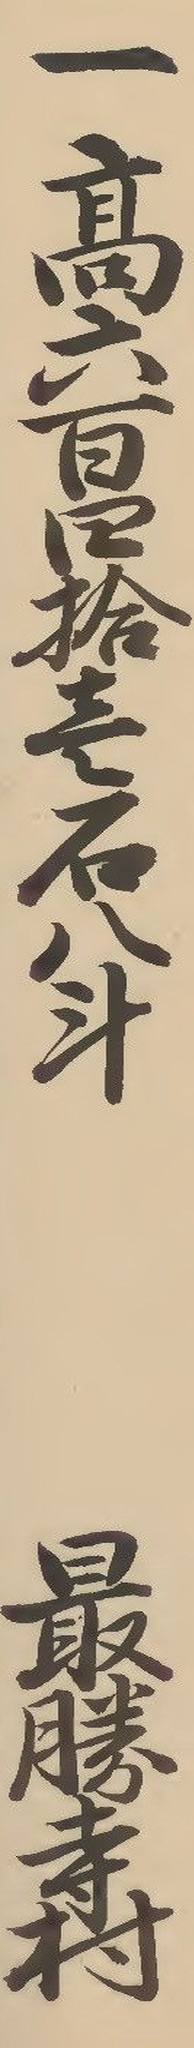一高六百四拾壱石八斗最勝寺村
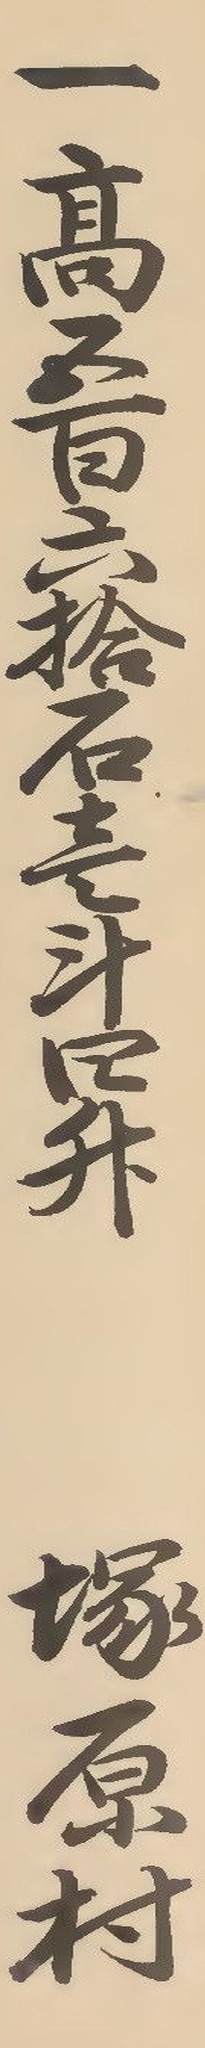一高五百六拾石壱斗四升塚原村
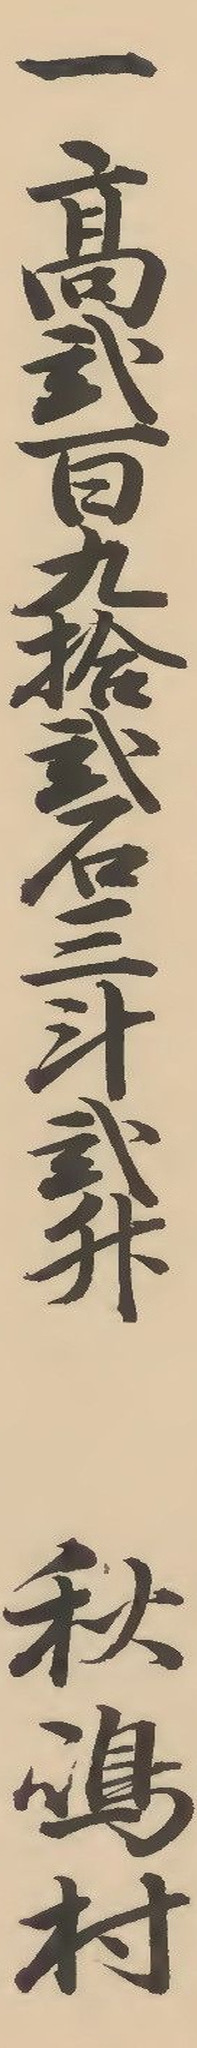一高弐百九拾弐石三斗弐升秋島村
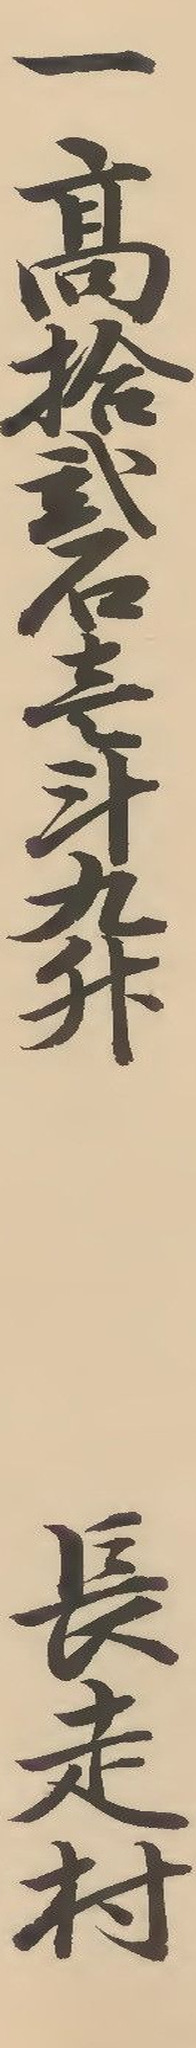一高拾弐石壱斗九升長走村
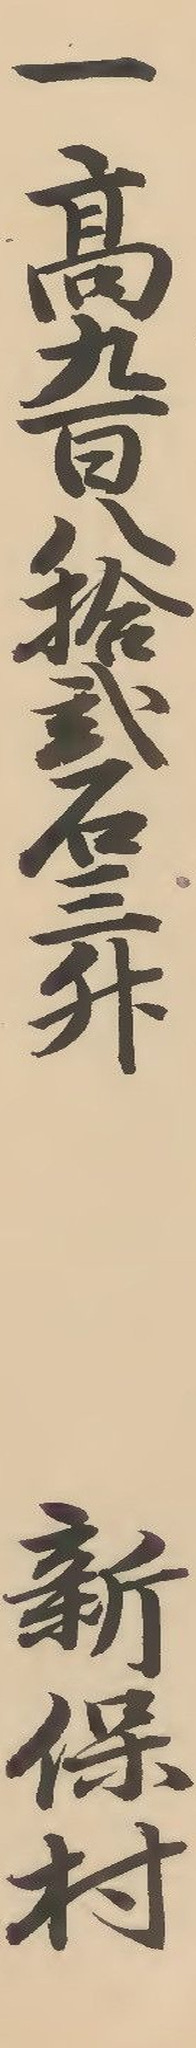一高九百八拾弐石三升新保村

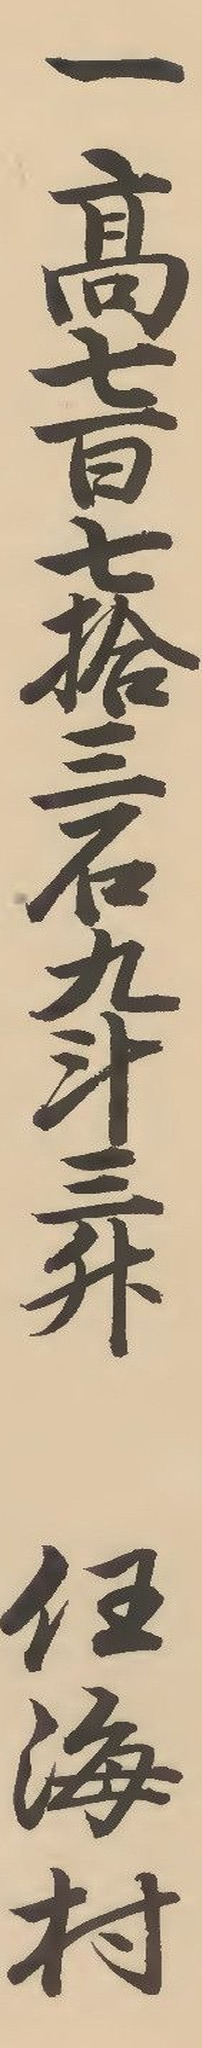一高七百七拾三石九斗三升任海村
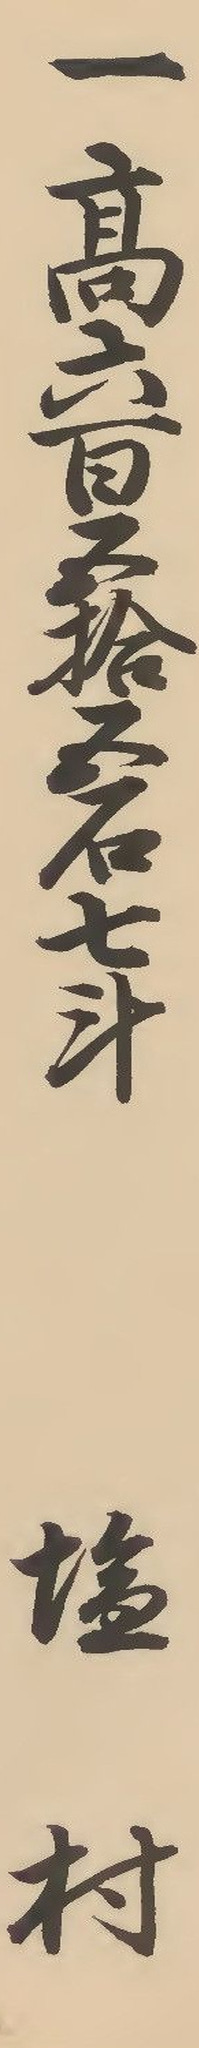一高六百五拾五石七斗塩村
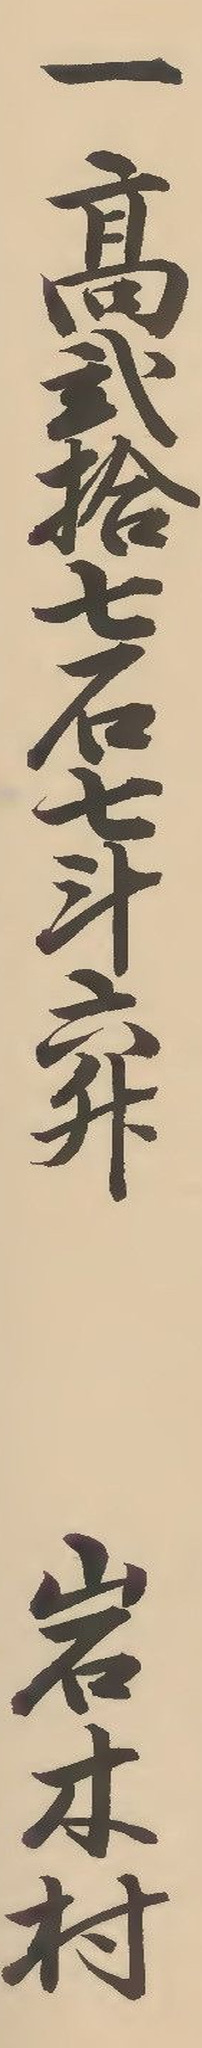一高弐拾七石七斗六升岩木村
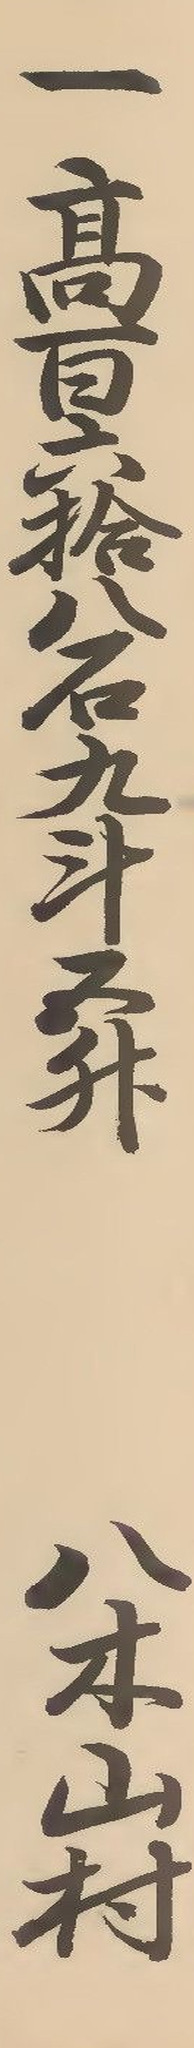一高百六拾八石九斗五升八木山村
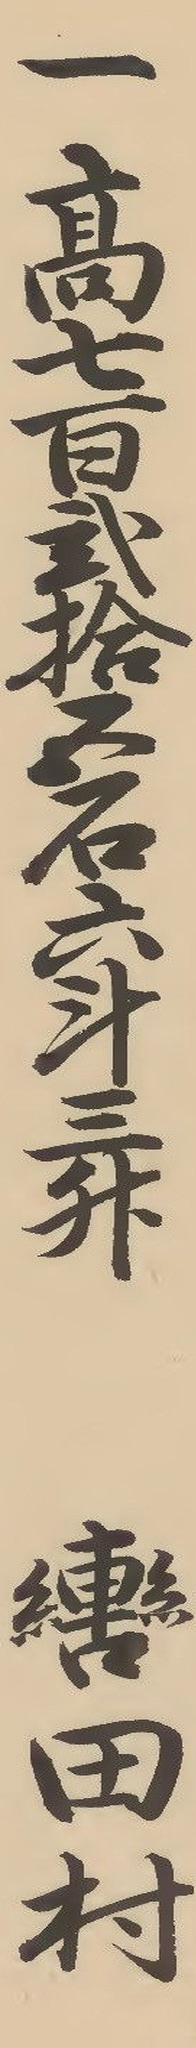一高七百弐拾五石六斗三升轡田村
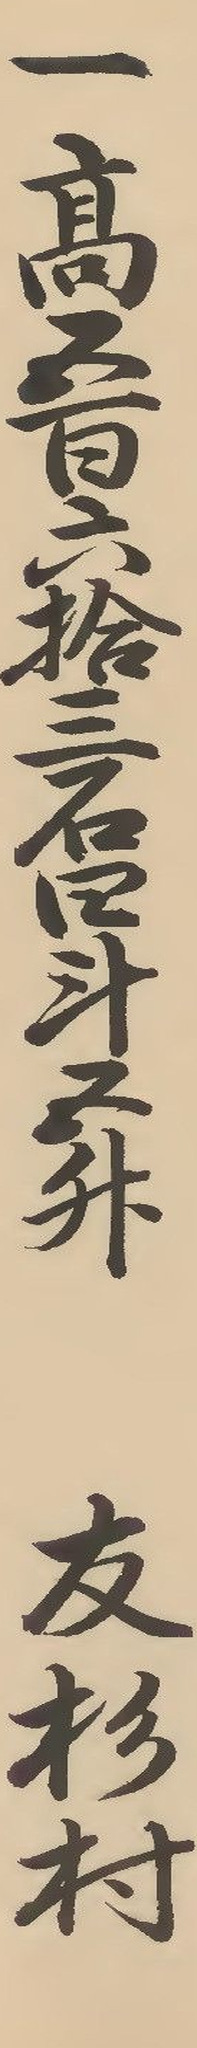一高五百六拾三石四斗五升友杉村
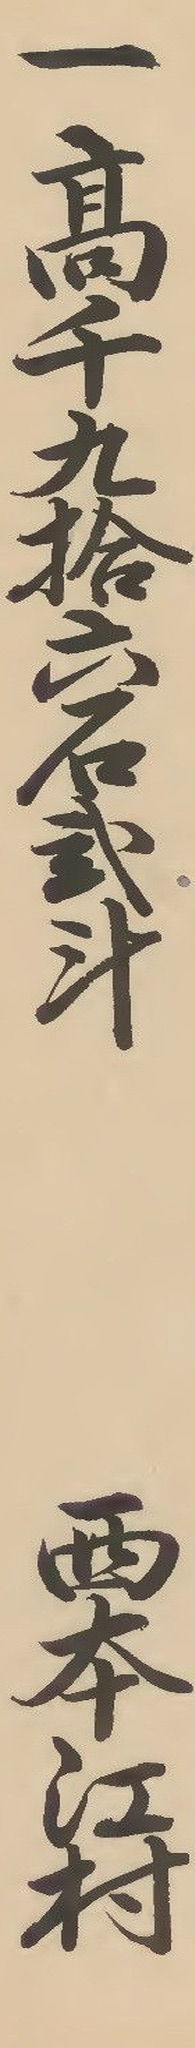一高千九拾六石弐斗西本江村

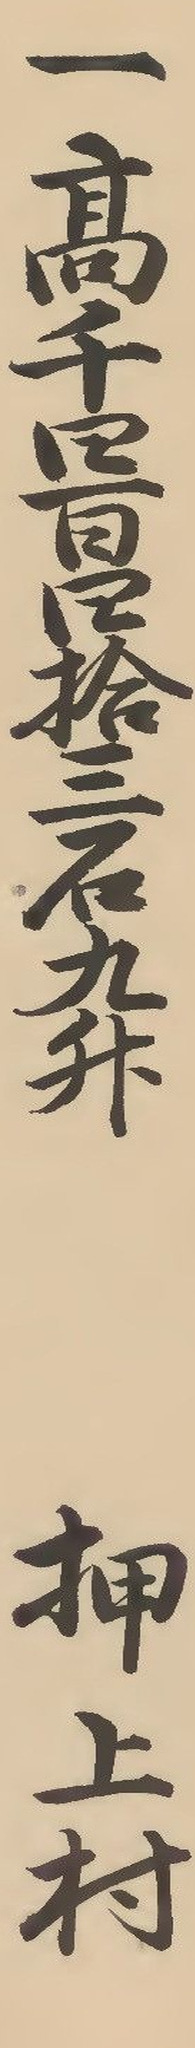一高千四百四拾三石九升押上村
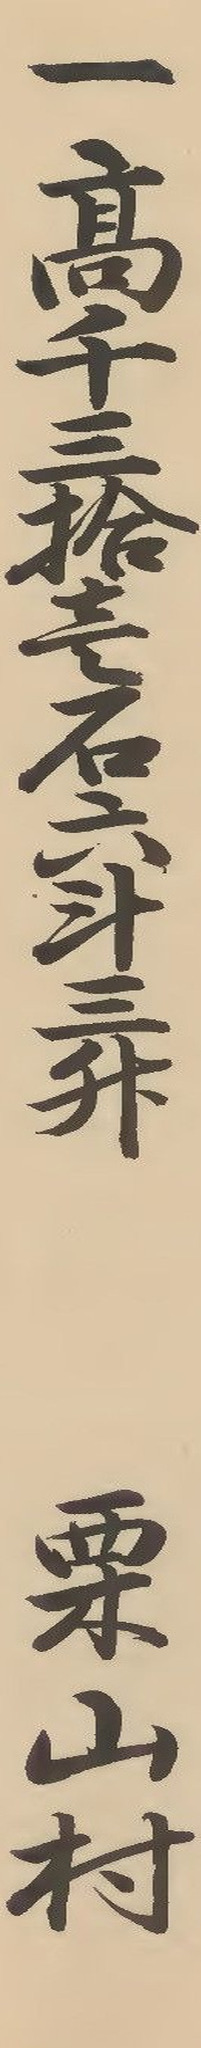一高千三拾壱石六斗三升栗山村
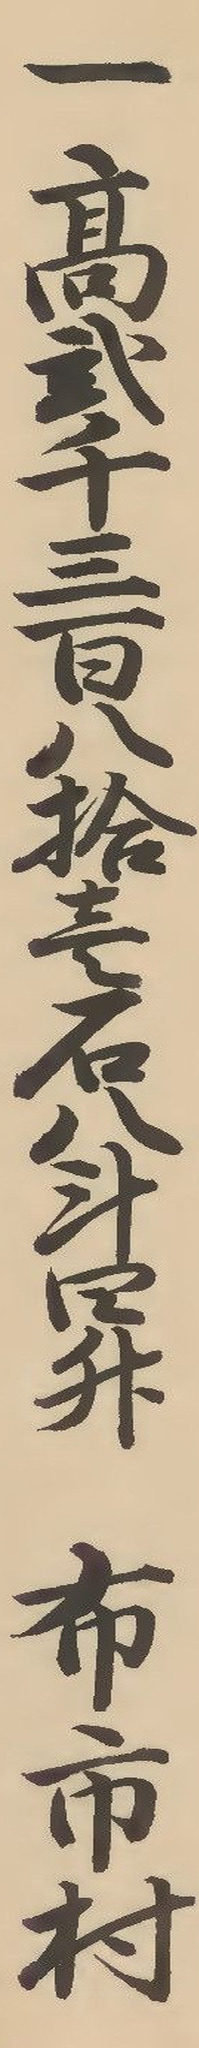一高弐千三百八拾壱石八斗四升布市村
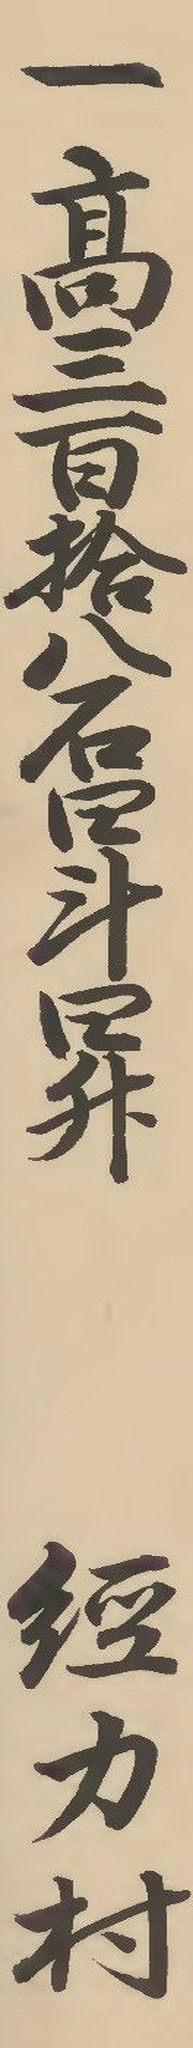一高三百拾八石四斗四升経力村
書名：越中国郷帳
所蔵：国立公文書館 National Archives of Japan
